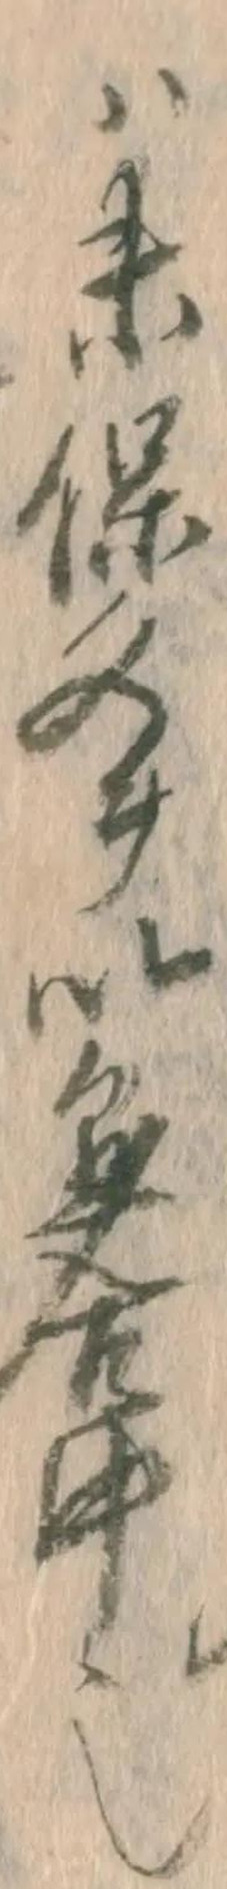ハ未保文ヲ以合中也
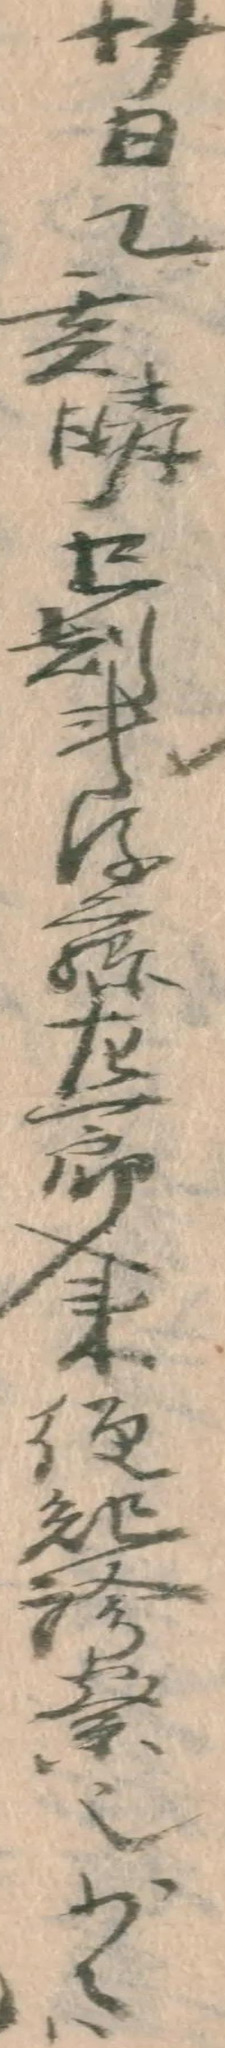廿日乙亥晴巳刻斗後藤左一郎入来経紀診察也少々ハ
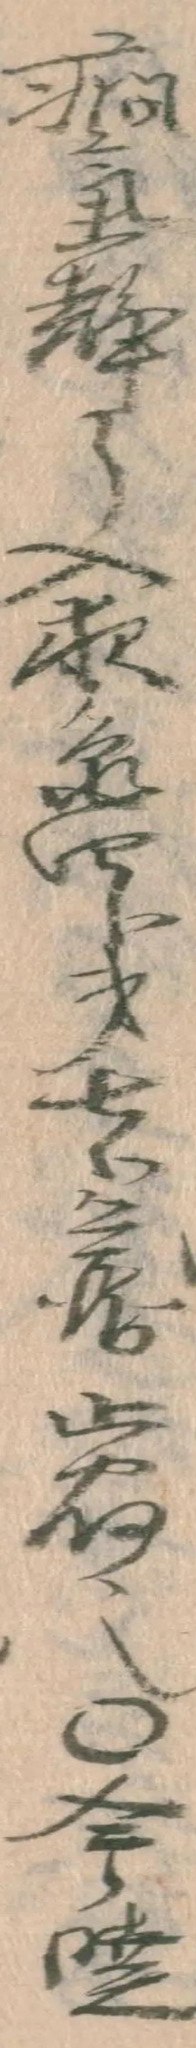癇氣静了入夜亀四郎第七郎兵衛止宿也○今暁
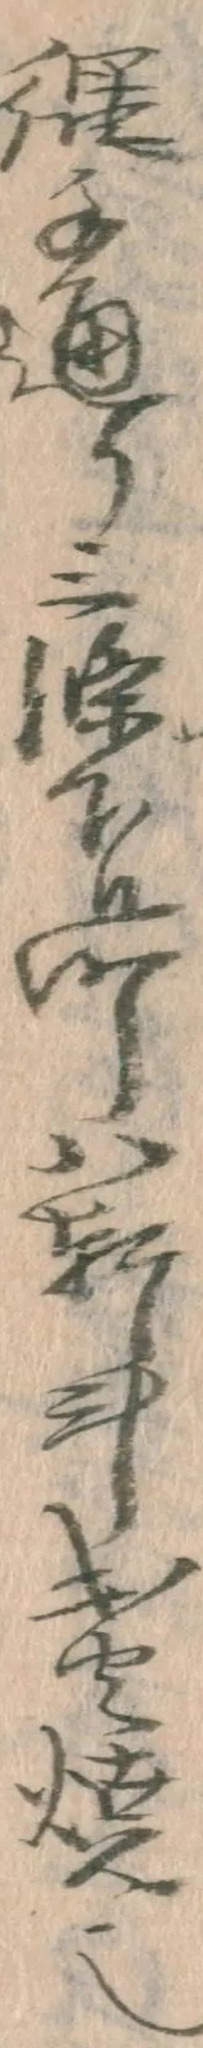縄手通り三條下ル町ハ軒斗出火焼也
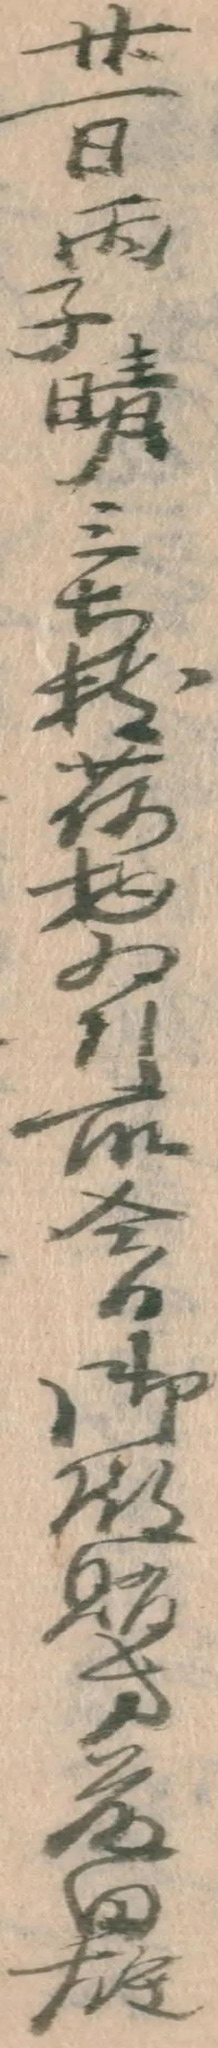廿一日丙子晴三ち持荷物為引取今日御殿賄方藤田雄
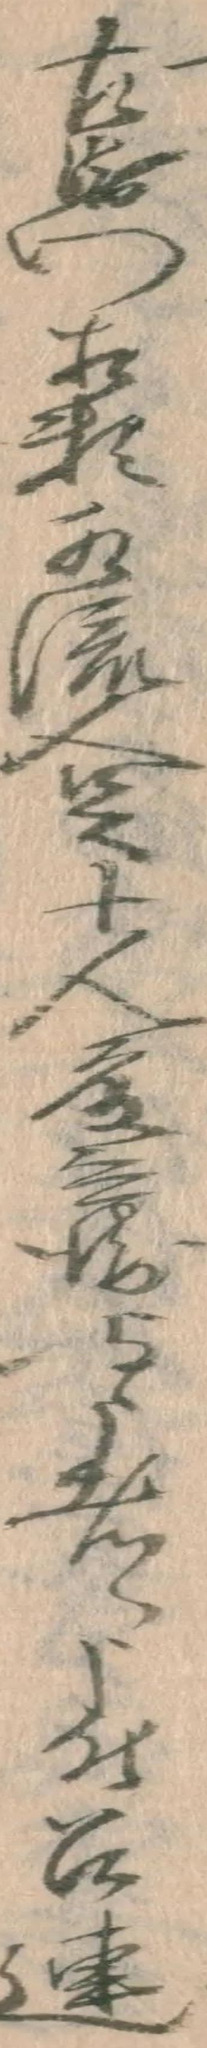左衛門相頼水流人足十人藤兵衛と申者へ申付召連
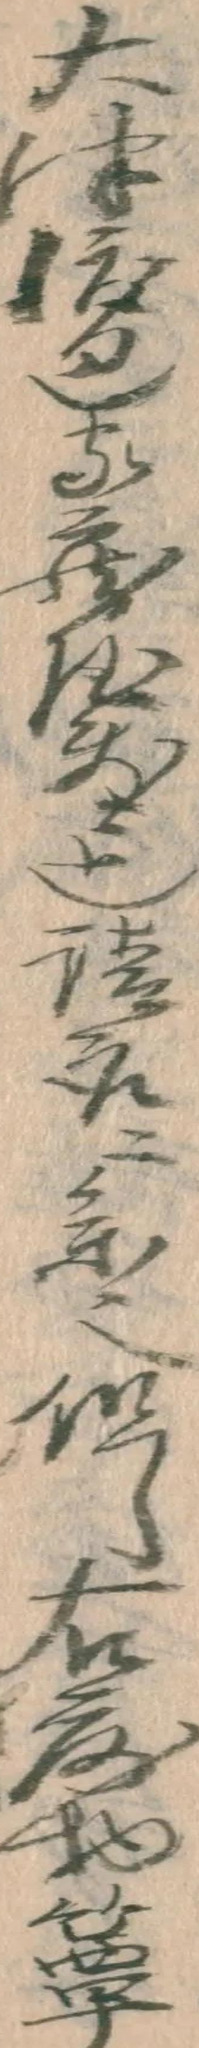大津渡辺家蔵屋敷迄請取ニ参也但し右荷物箪
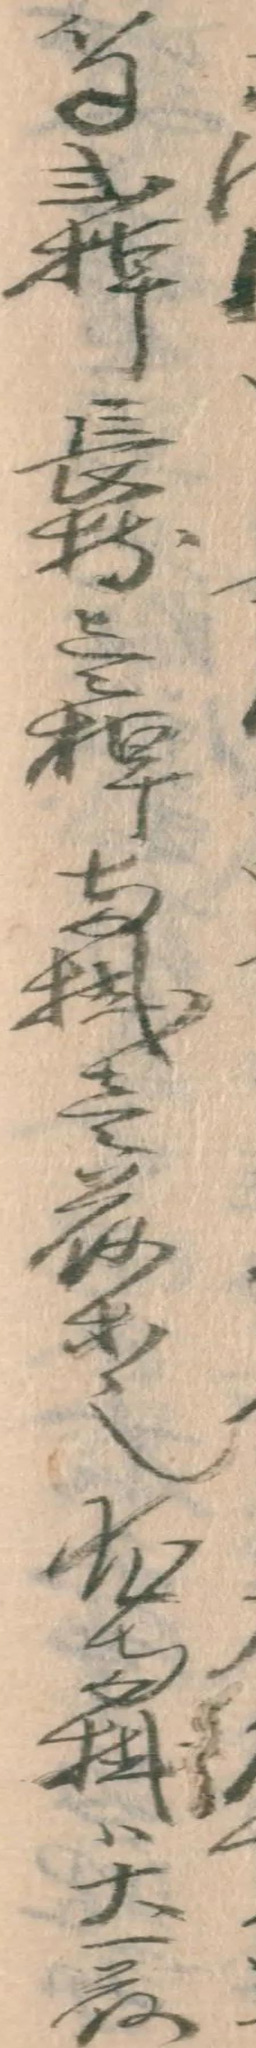笥弐棹長持壱棹両拭壱荷等也尤両掛は大一荷
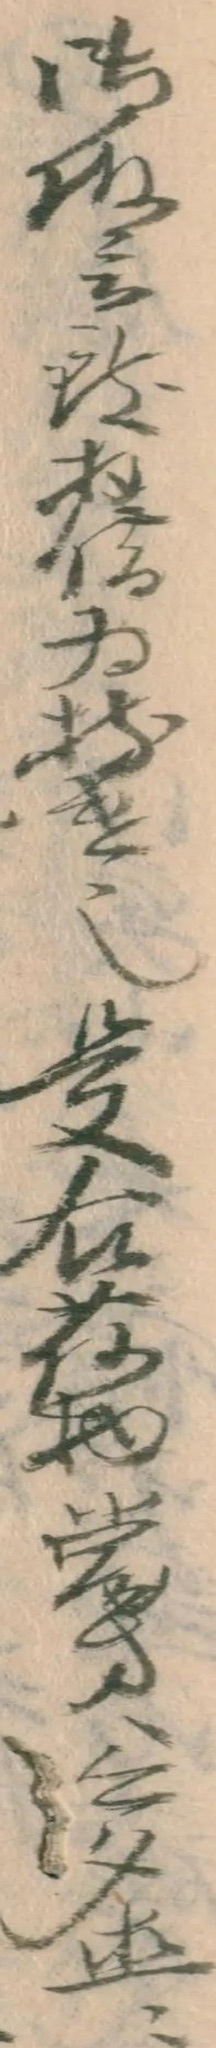御殿ニ而致拝借為持遣也且又右荷物當方へ今夕直ニ
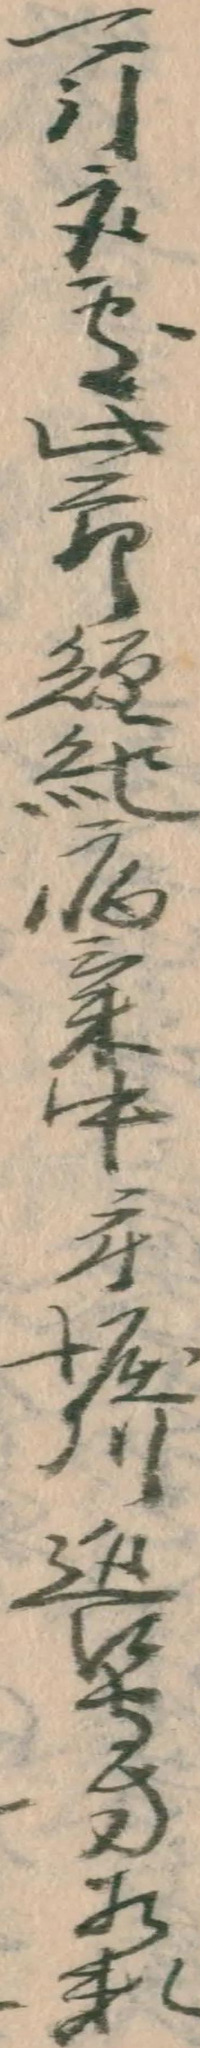可引取處此節経紀病氣中ニ付堀川近江守方相頼
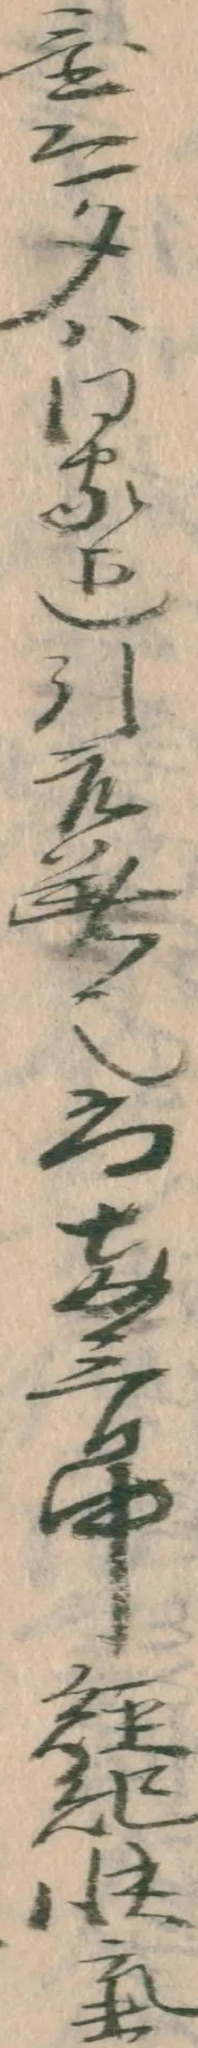置今夕ハ同家迄引取着也尚㐂三郎中経紀快氣
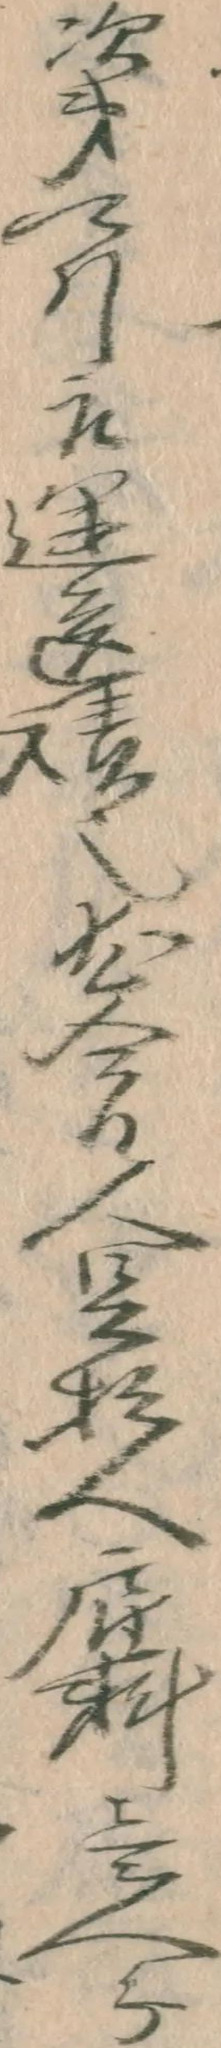次第可引取運送積之尤今日人足拾人雇料壱人分
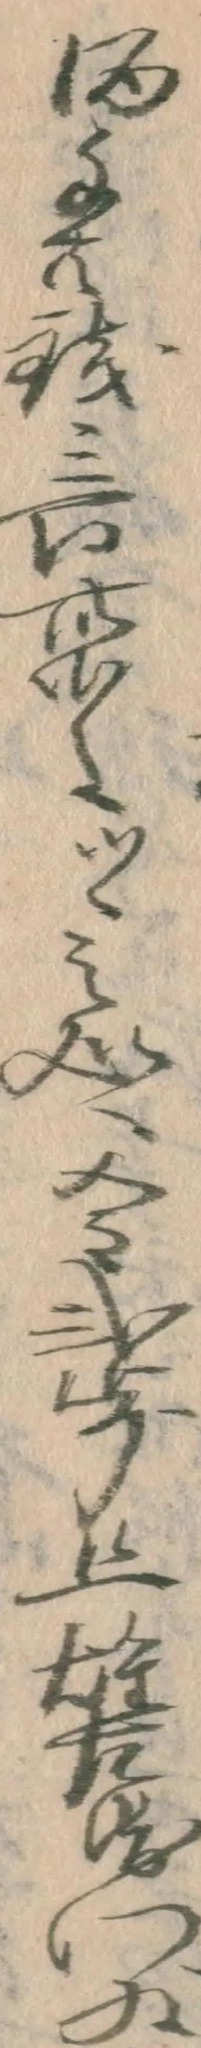酒手共銭三百廿弐文ツヽ之処へ金弐歩上雄左衛門為
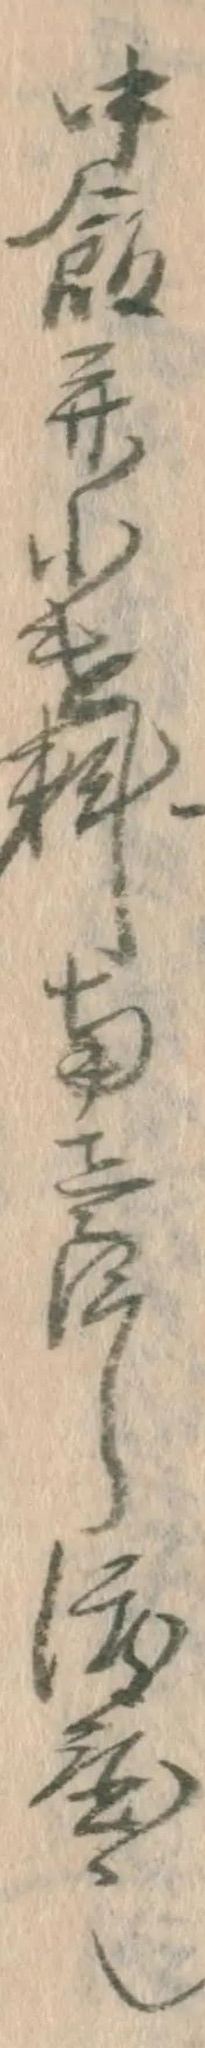中飯并小遣料南壱位り渡置也
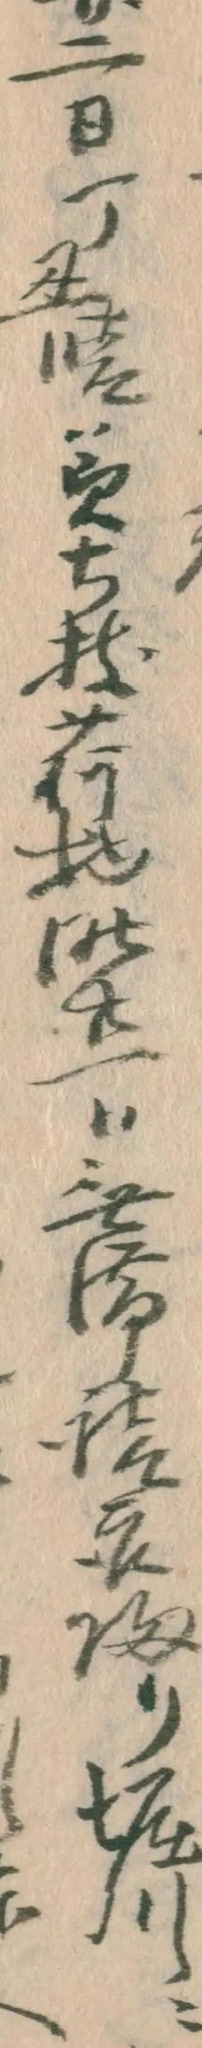廿二日丁丑晴みち枝荷物昨廿一日無滞請取帰り堀川ニ
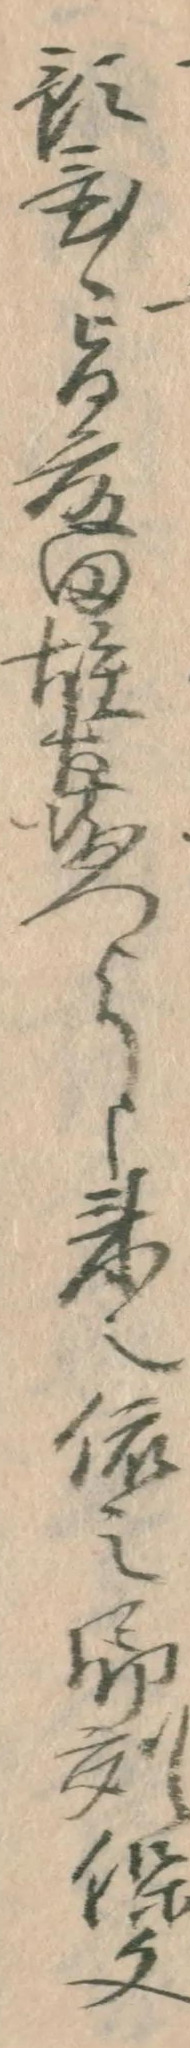預置候旨藤田権左衛門より来也依之即刻保文
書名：賀茂社記録. 第67冊
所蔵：国立国会図書館 National Diet Library, JAPAN
